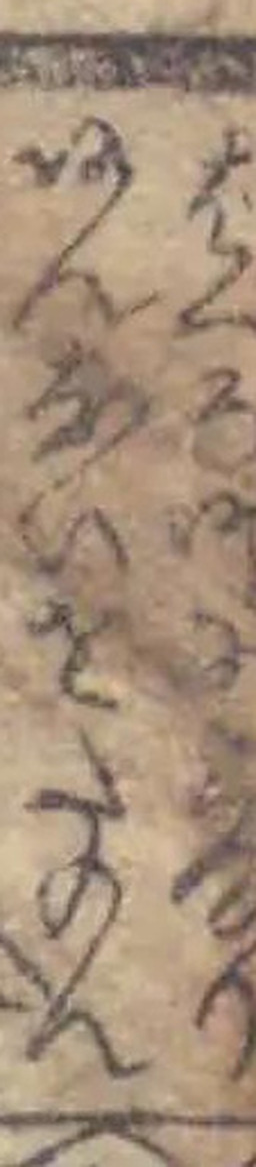あんないをたのんで
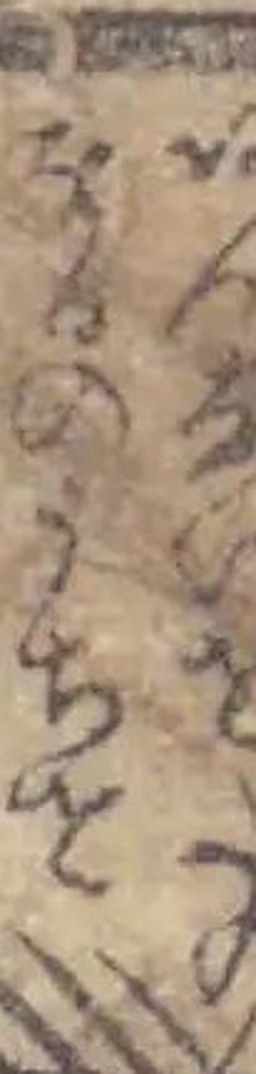まるのうちを
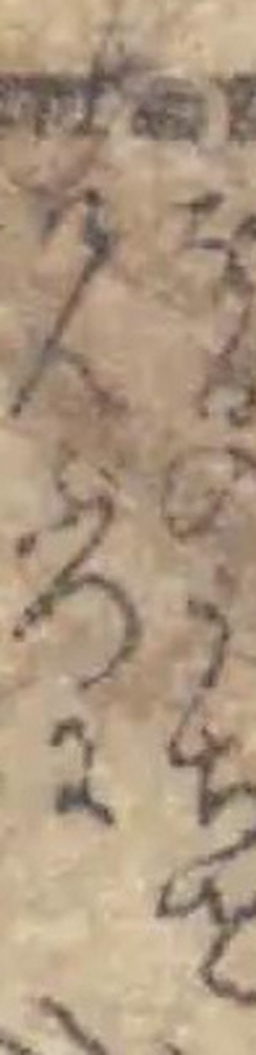けんぶつに
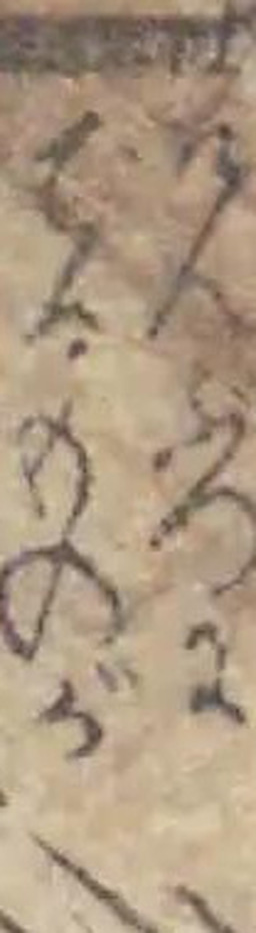でるものが
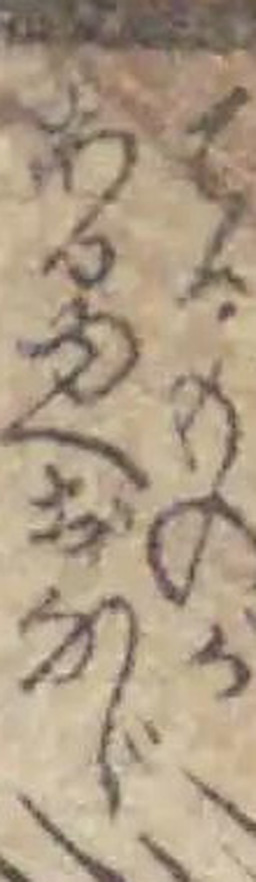あるゆへおなじ
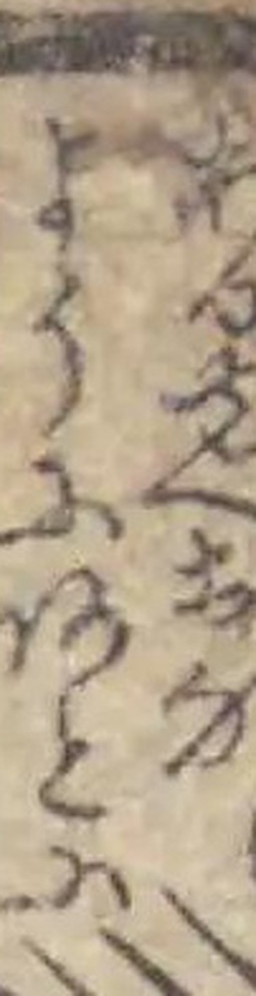ようにあとに
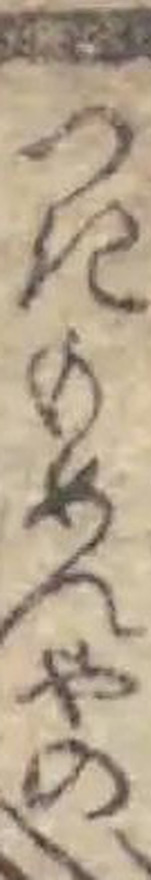つきもめんやの
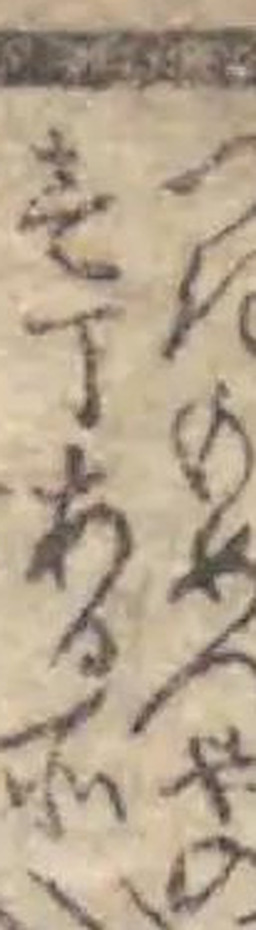壱丁ある所
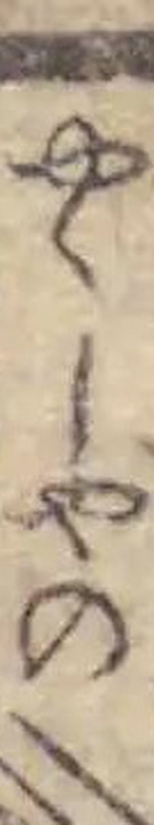やくしやの
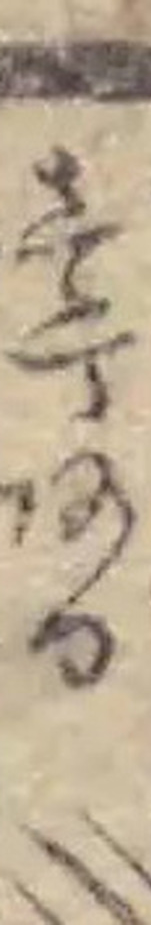壱丁ある
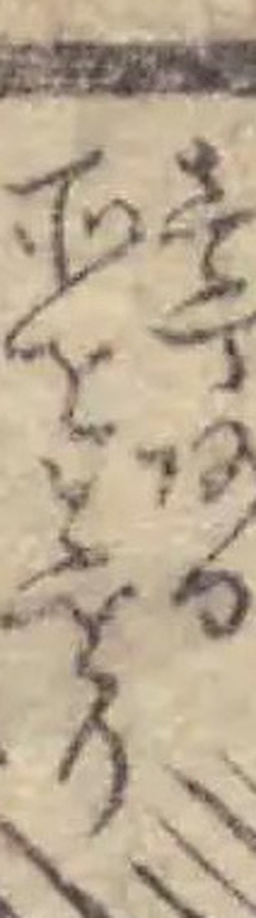所をとをり
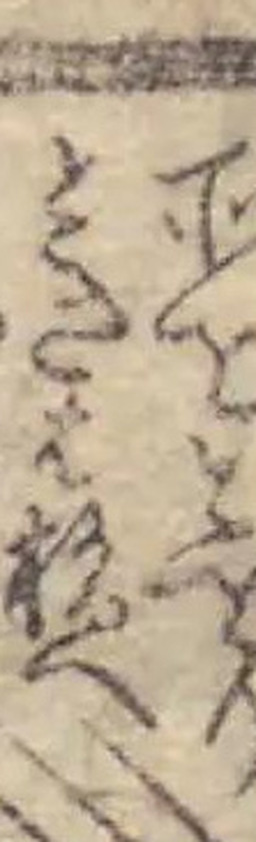ときは橋へ
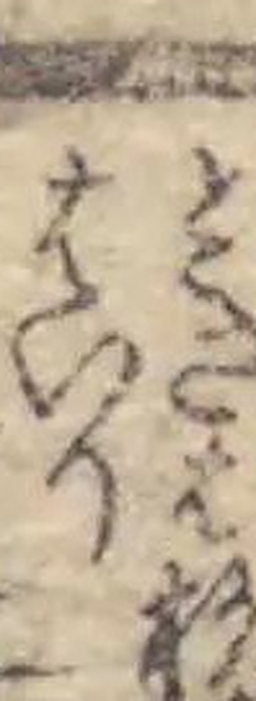はいり
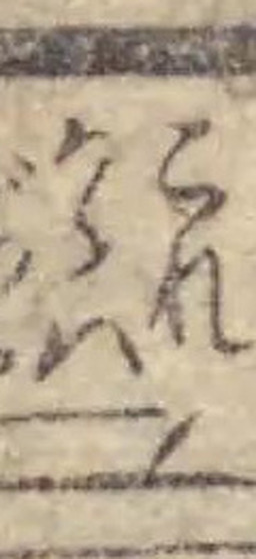からハ
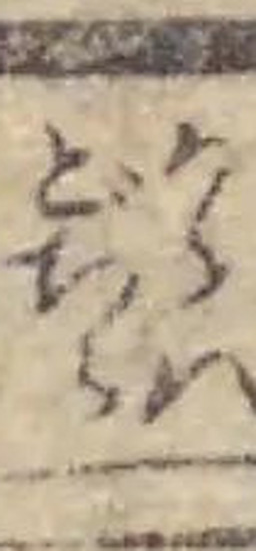どちら
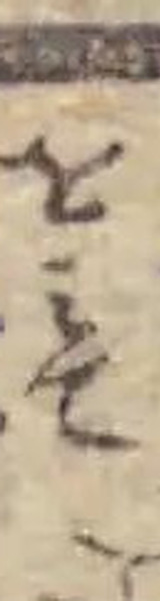をミて
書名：豆男江戸見物 2巻
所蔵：国立国会図書館 National Diet Library, JAPAN
